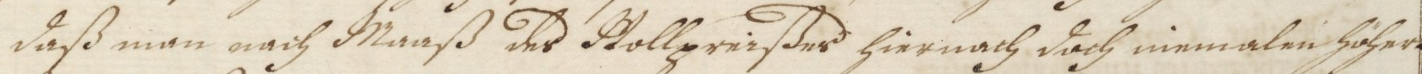daß man nach Maaß des Wollpreißes hiernach doch niemalen höhere
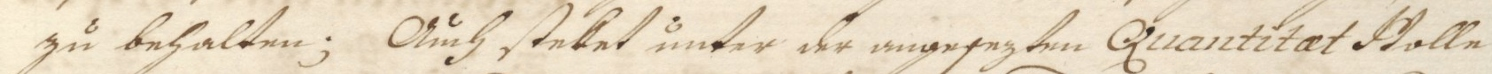zu behalten. Auch steket unter der angesezten Quantitaet Wolle
